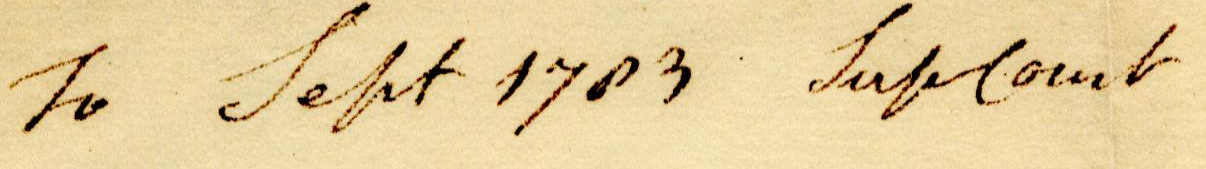to Sept 1783 Supr Court
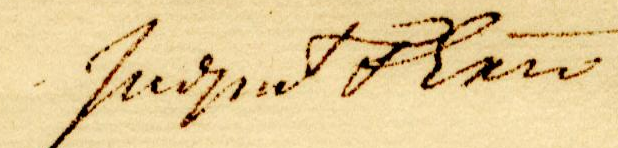Joseph Ham
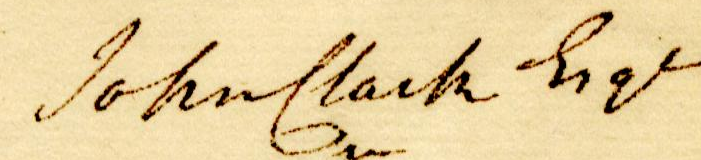John Clark Esq^r
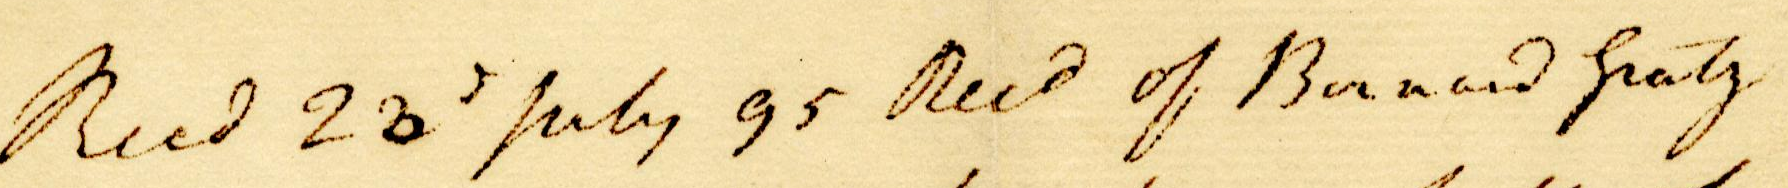Rece^d 26^th July 95 Rec^d of Barnard Gratz
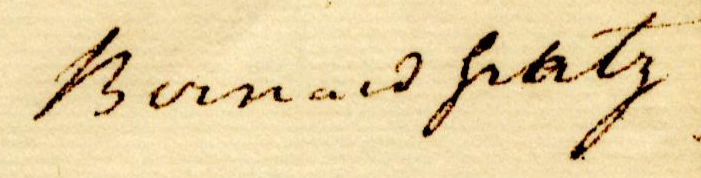Barnard Gratz
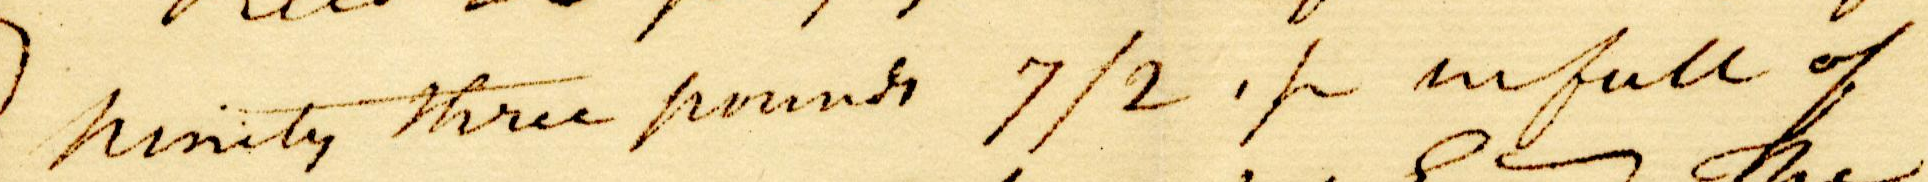Ninety Three Pounds 7s2 p in full of
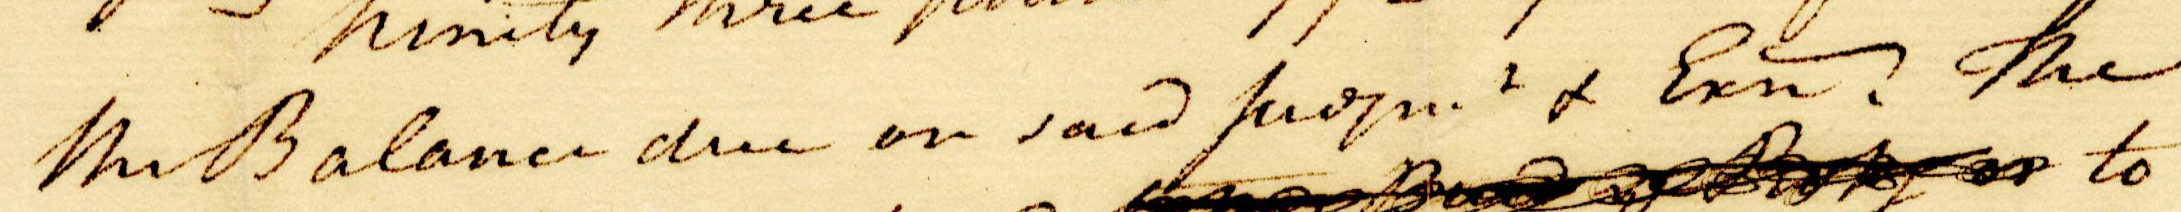the Balance due on said prop^t. & Exn^d the
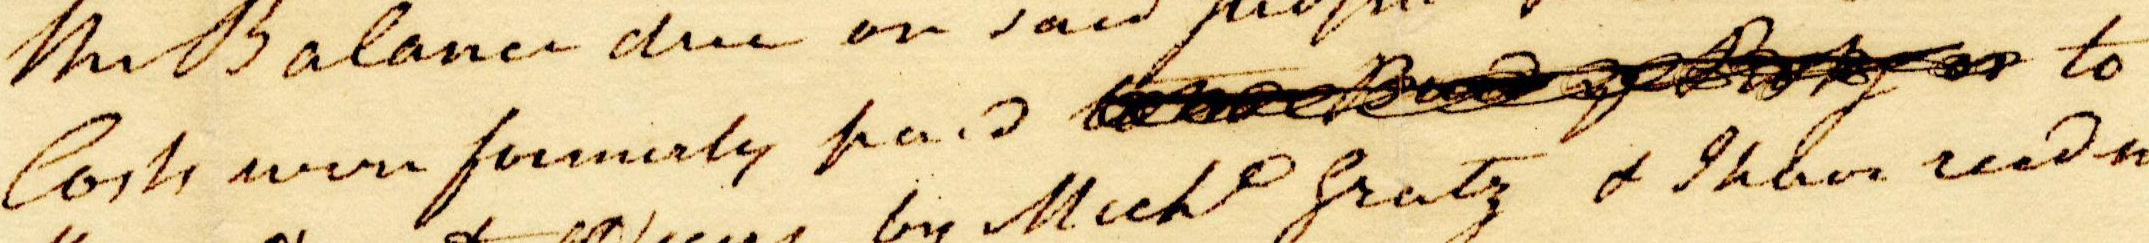costs were formerly had [____] [_____] [_____] [__] to
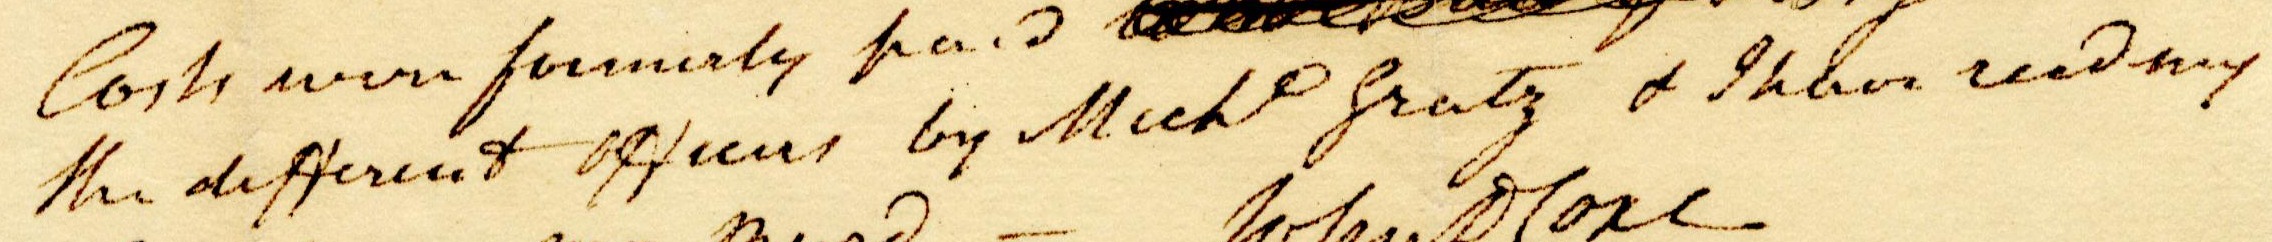the different offers by Mich^l Gratz & I haves rec^d my
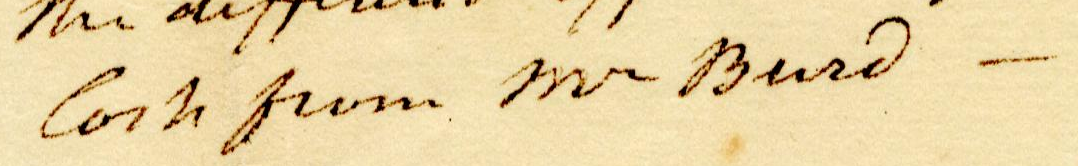coin from Mr. Bard.-
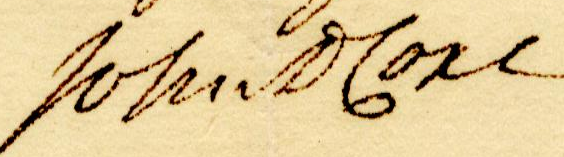John D Cox
